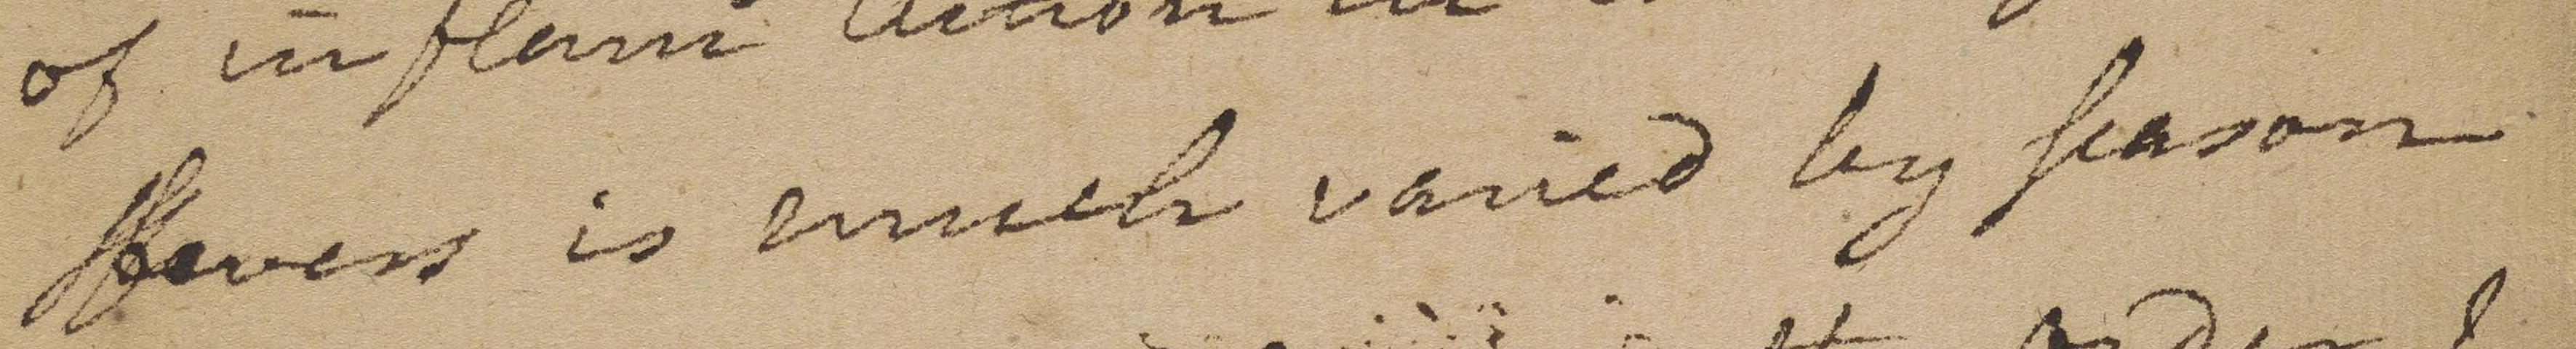fevers is much varied by Season
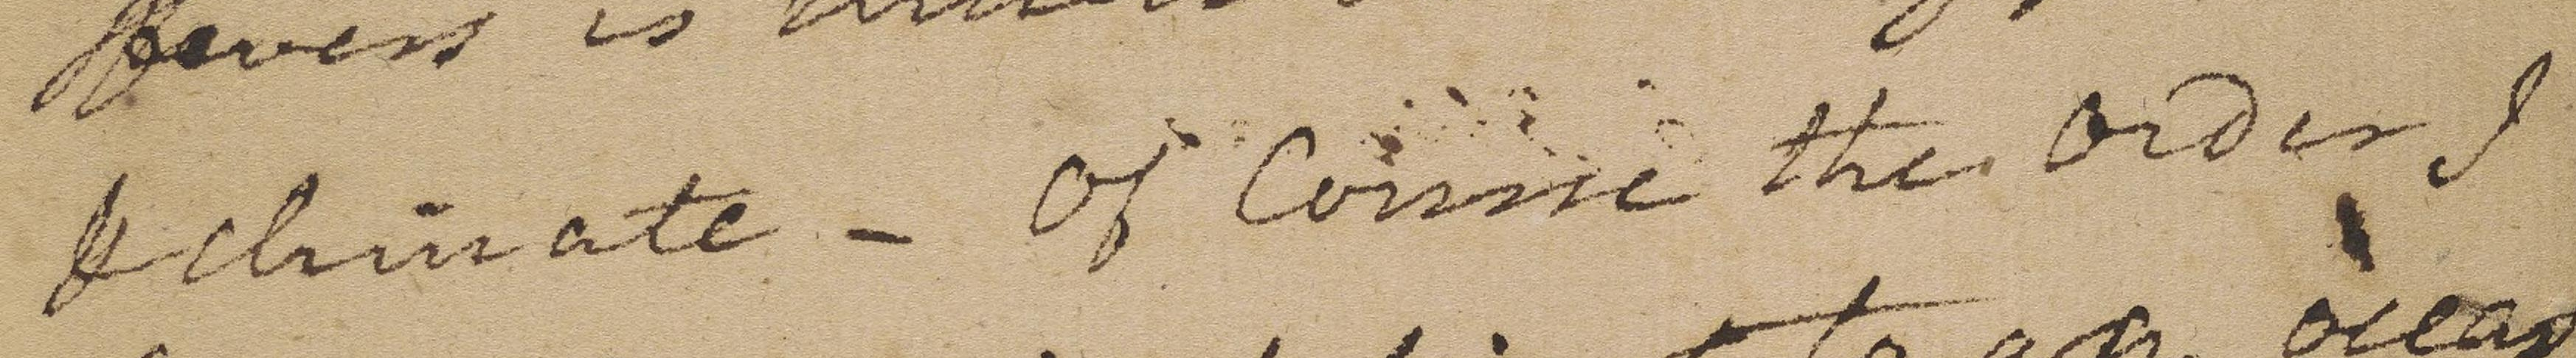& climate, of course the order I
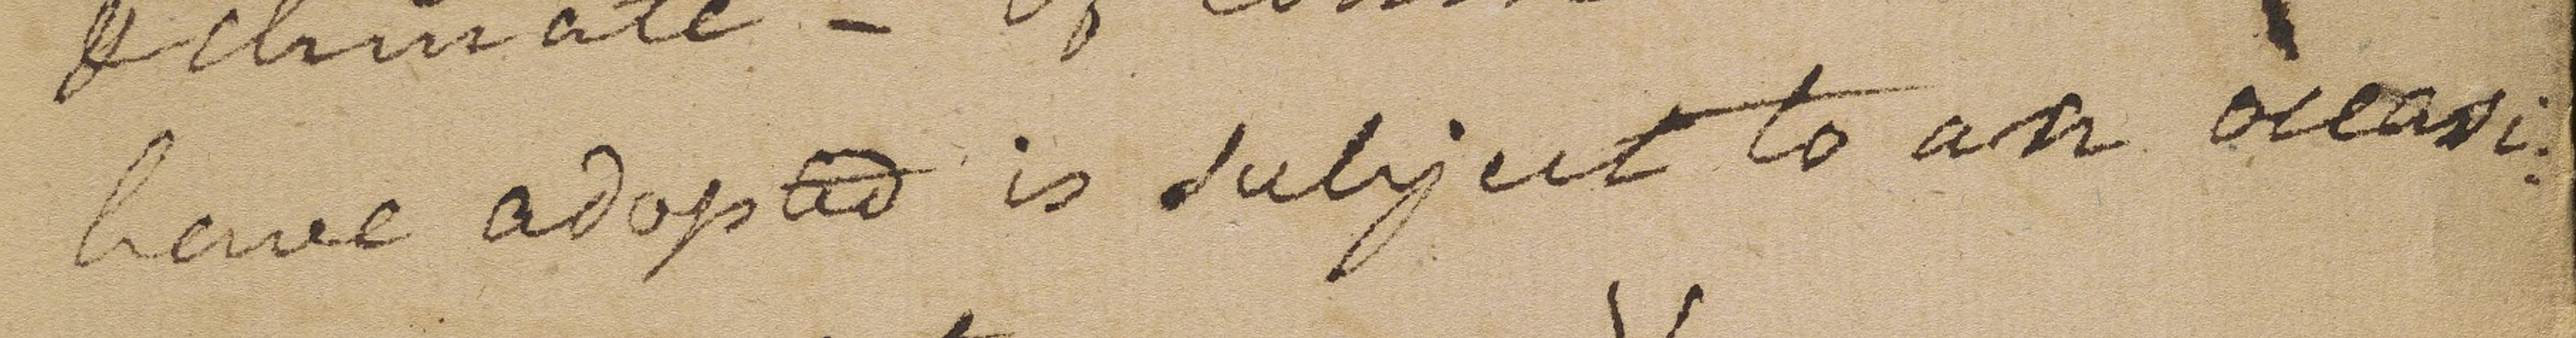have adopted is subject to an occasi-
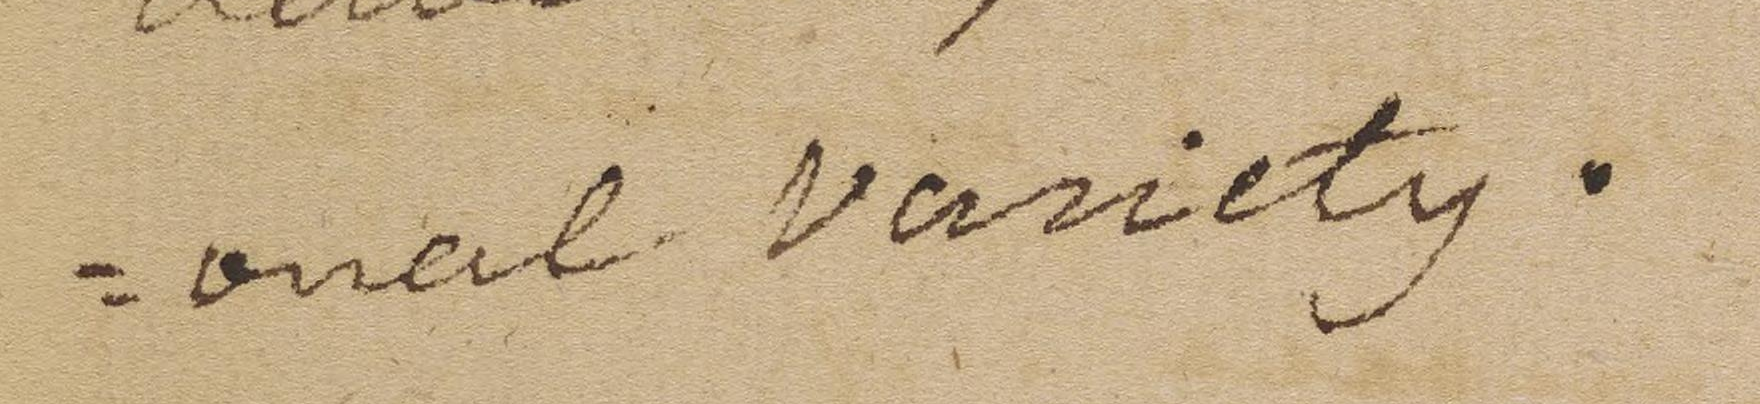-onal variety.
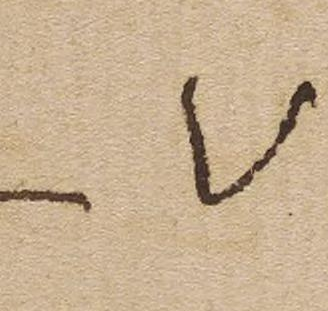V
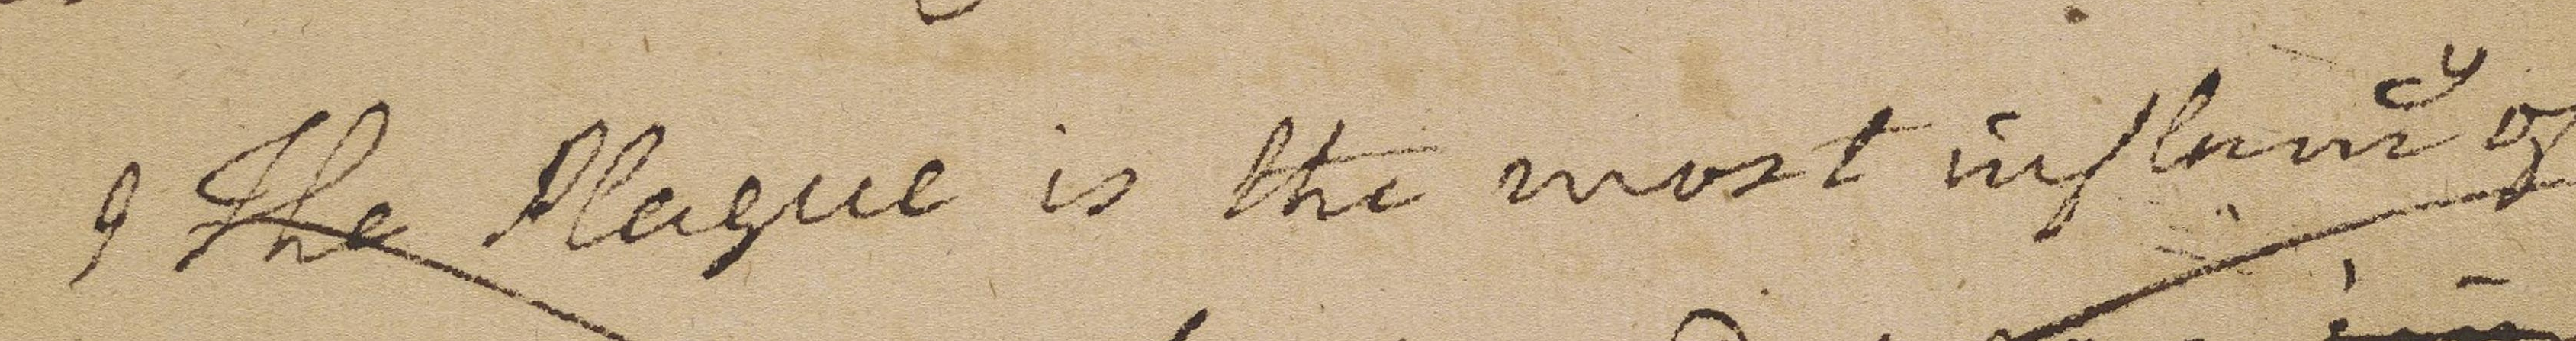The Plague is the most inflam^y of
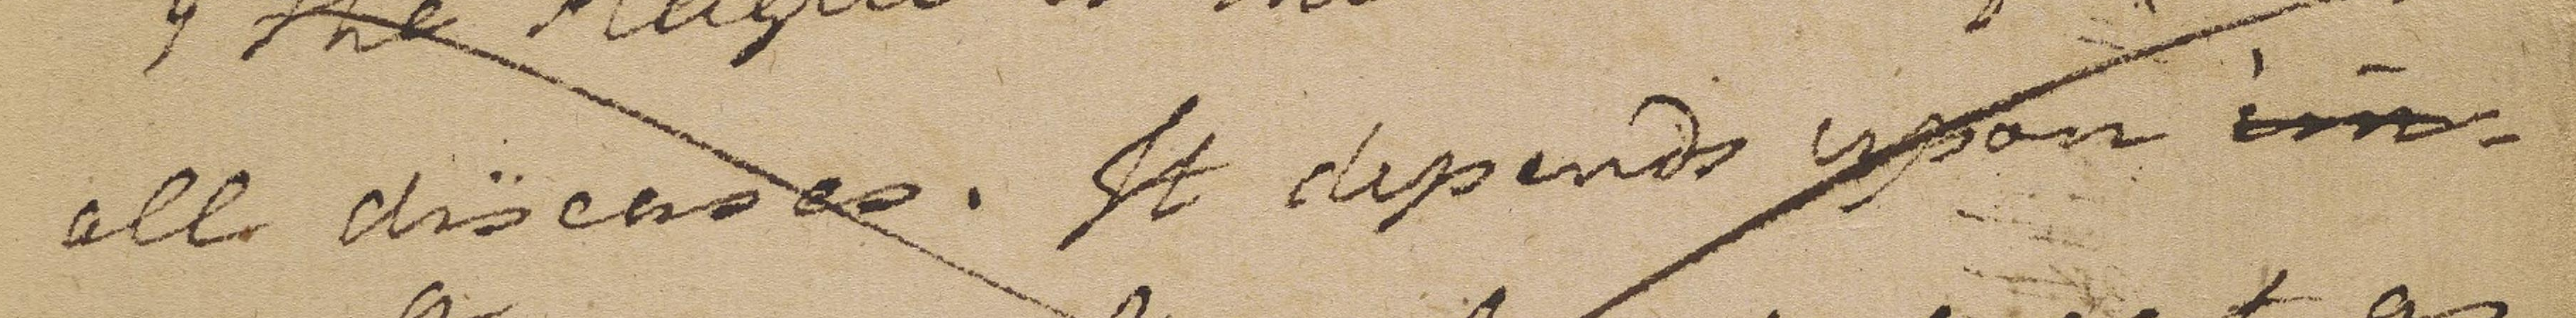all diseases. It depends upon [im-]
